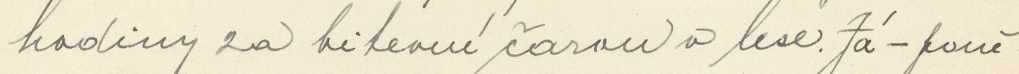hodiny za bitevní čarou v lese. Já - poně-
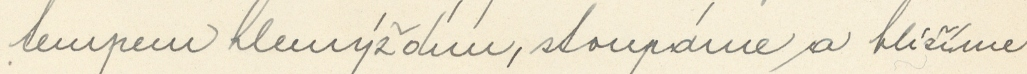tempem hlemýždím, stoupáme a blížíme
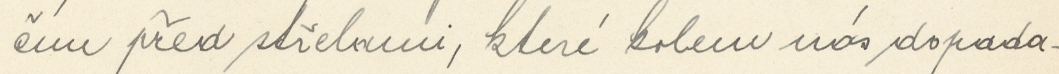čím před střelami, které kolem nás dopada-
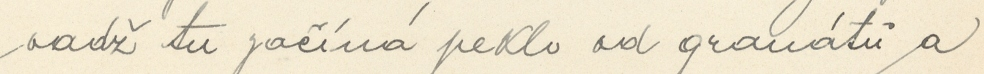vadž tu začíná peklo od granátů a
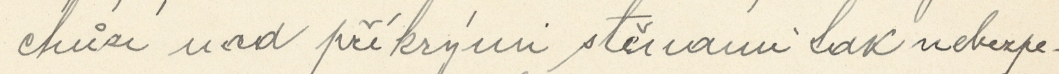chůzí nad příkrými stěnami tak nebezpe-
